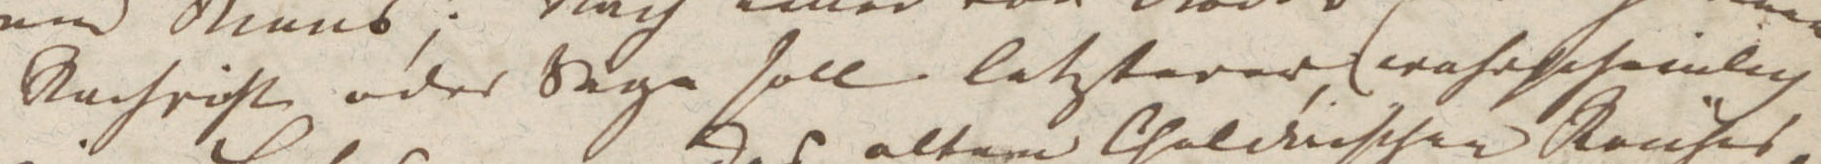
Nachricht oder Sage soll letzterer, (wahrscheinlich
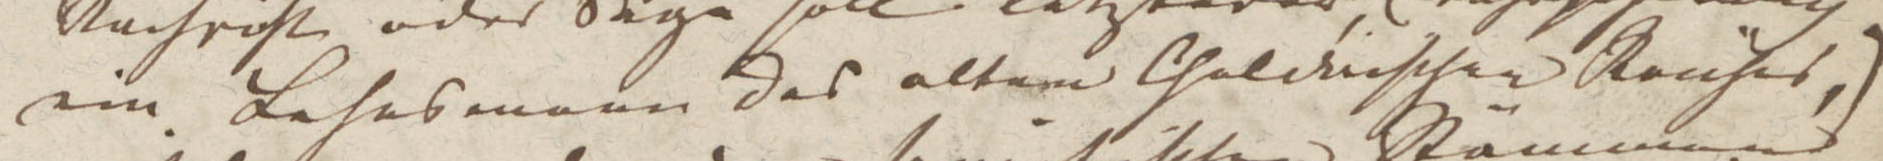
ein Lehnsmann des alten Chaldschen Reiches,)
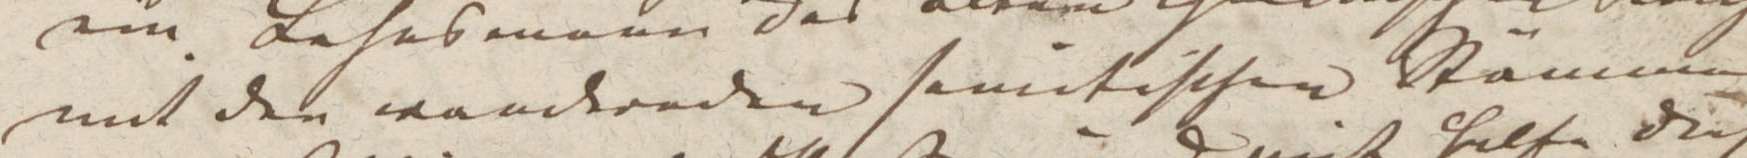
mit den wandernden semitischen Stämmen
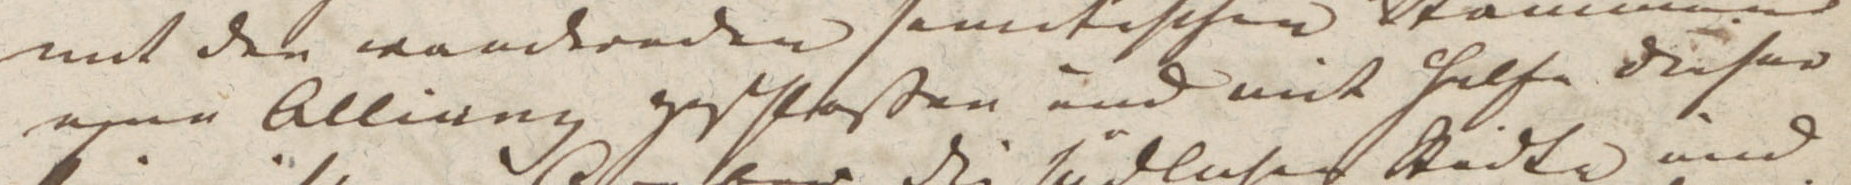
eine Allianz geschlossen und mit Hulfe dieser
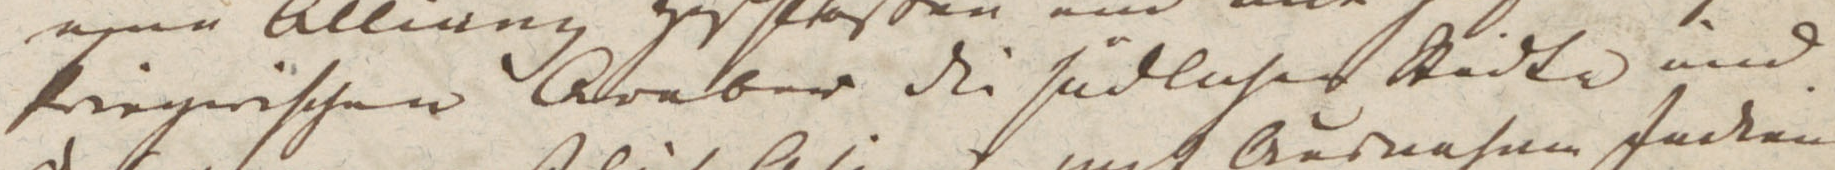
kriegerischen Araber die südlichen Städte und
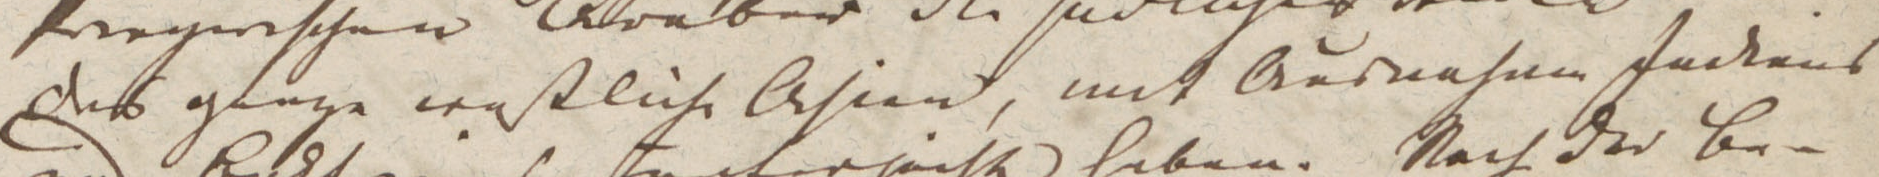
das ganze westliche Asien, mit Ausnahme Indiens
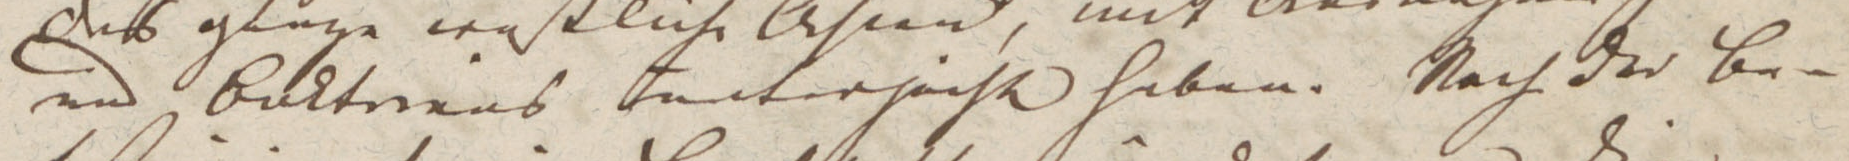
und Baktriens unterjocht haben. Nach der Be-
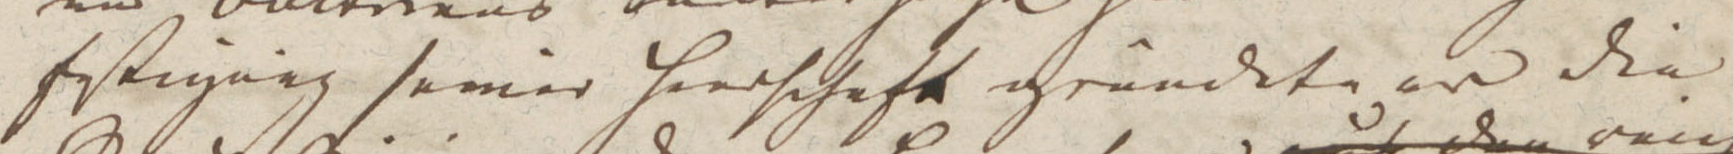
festigung seiner Herrschaft gründete er die
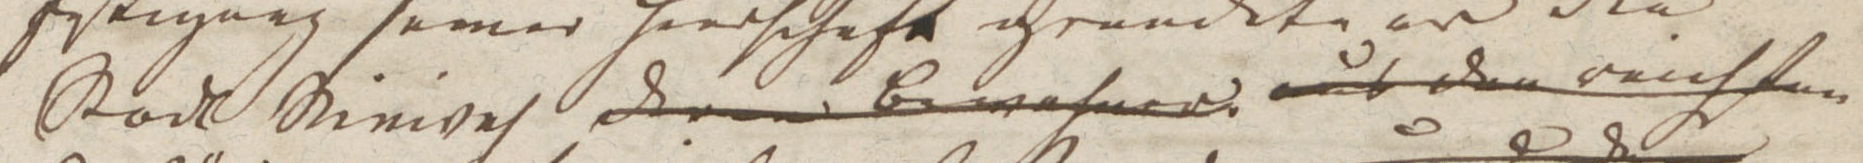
Stadt Niniveh deren Bewohner aus den reichsten
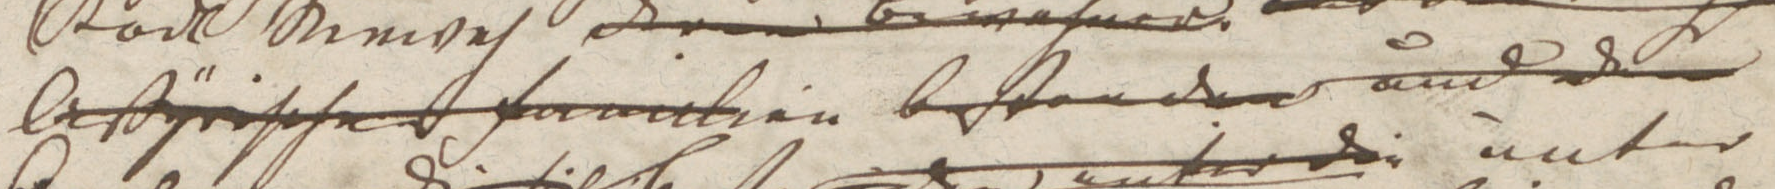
Assyrischen Familien bestanden und den
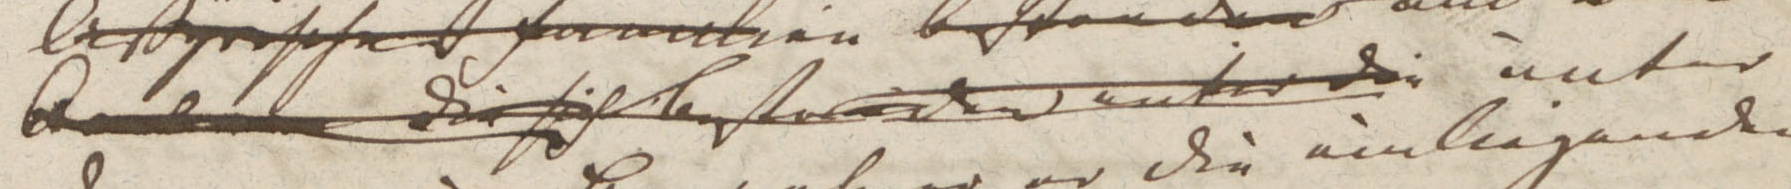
Arabern die sich bestanden unter die unter
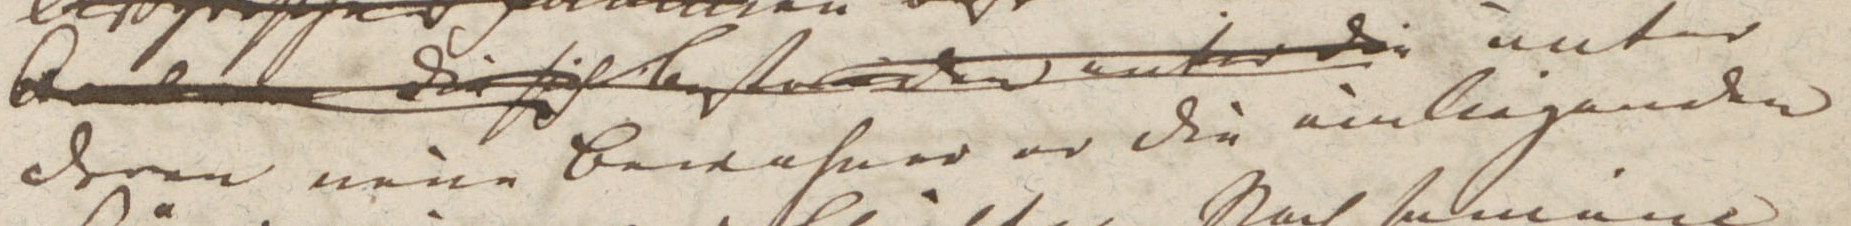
deren neue Bewohner er die umliegenden
